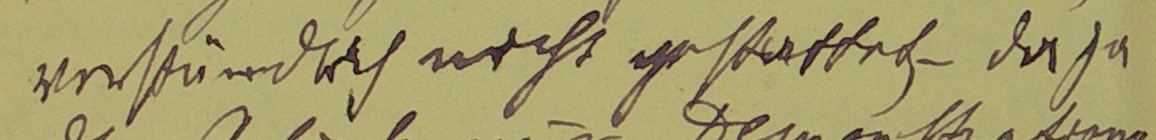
verständlich nicht gestattet-. Da ja
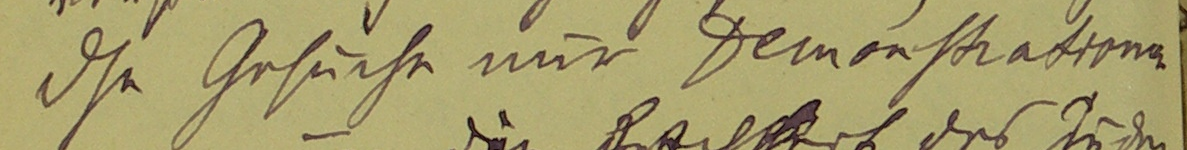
diese Gesuche nur Demonstration
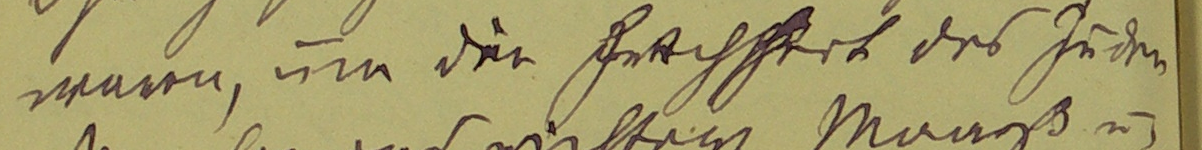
waren, um die Frechheit des Juden
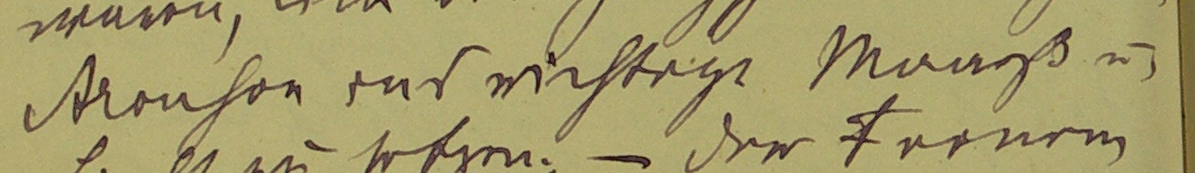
Aronson ins richtige Maaß und
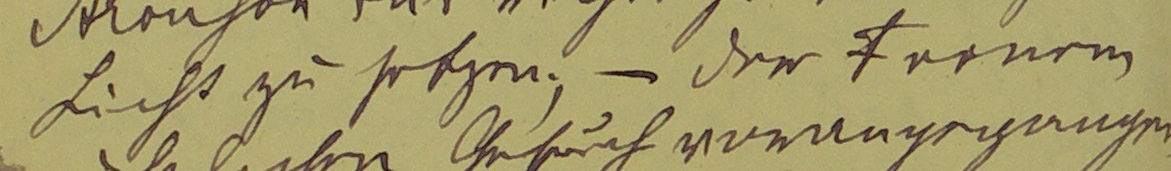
Licht zu setzen;- Dem Forum
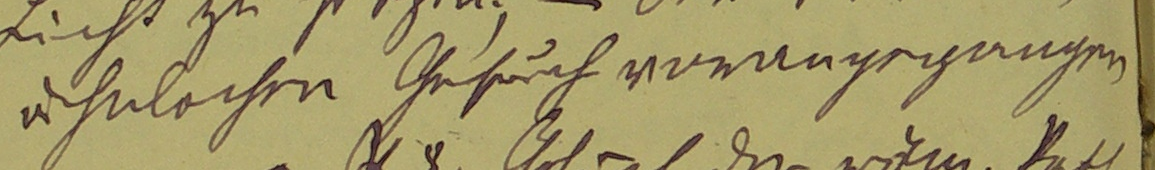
ähnlichen Gesuch vorangegangen
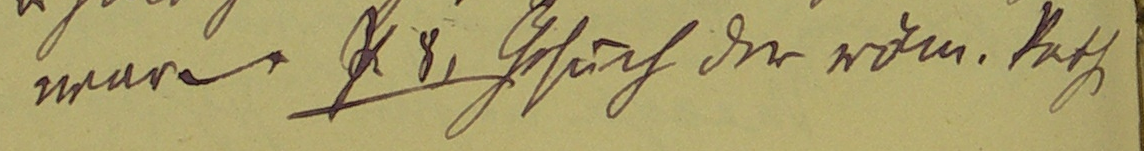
war P 8. Gesuch der röm. kath
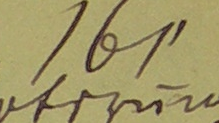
161
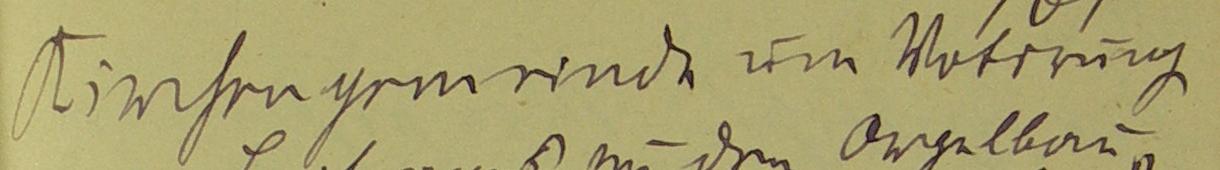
Kirchengemeinde zum Votierung
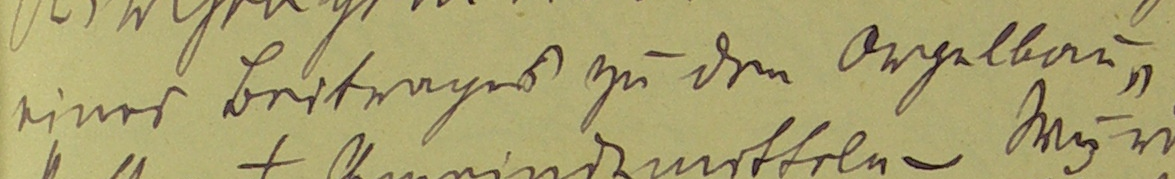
eines Beitrages zu dem Orgelbau¬
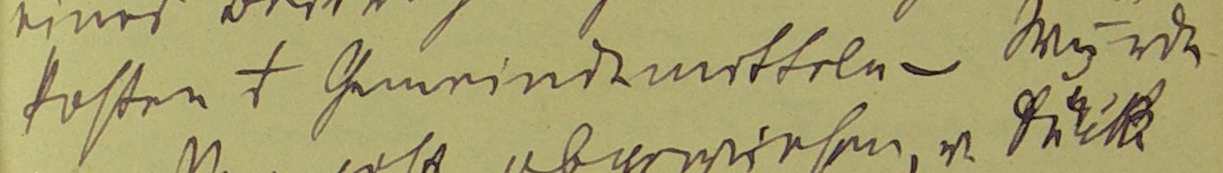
kosten mit Gemeindemitteln- Wurde
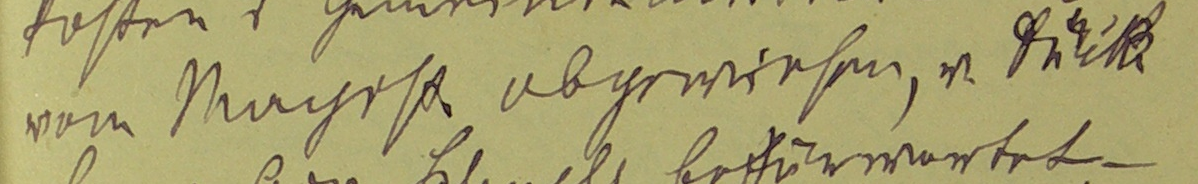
von Magistrat abgewiesen, von Dück
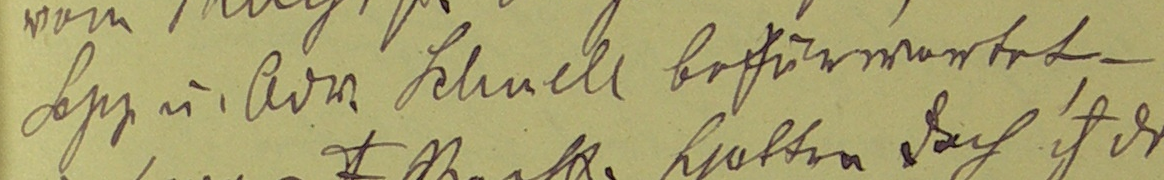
Sep und Adv. Schnell befürwortet
